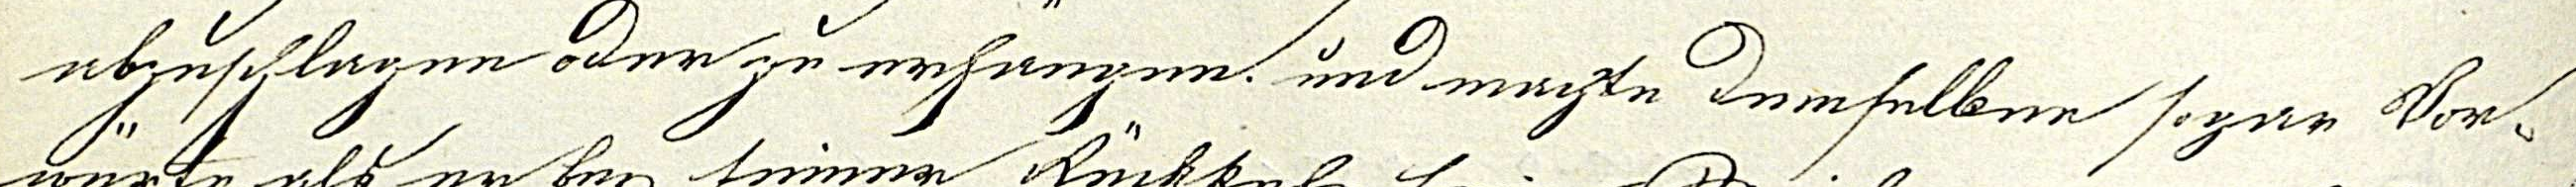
abzuschlagen oder zu erhängen und machte demselben sogar Vor¬
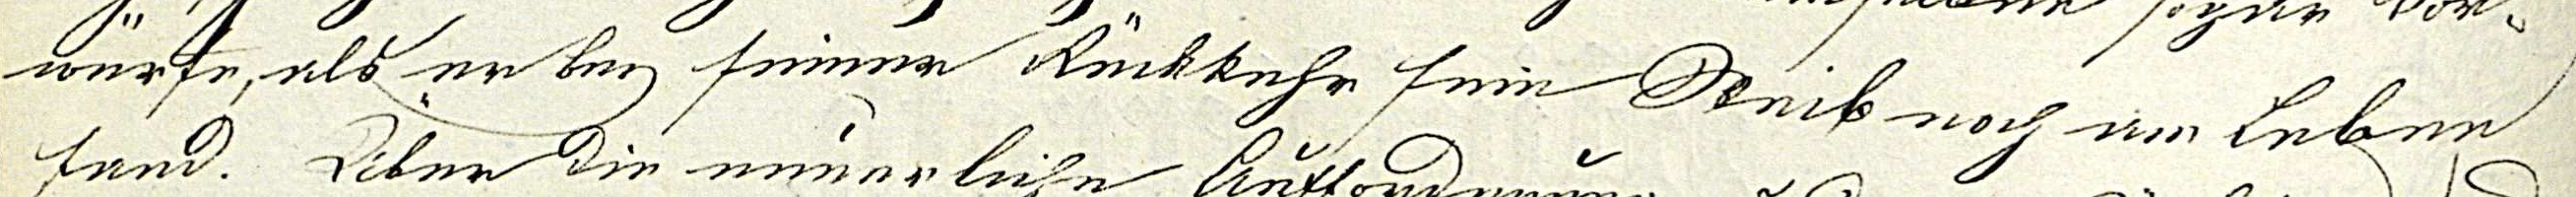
würfe, als er bey seiner Rückkehr sein Weib noch am Leben
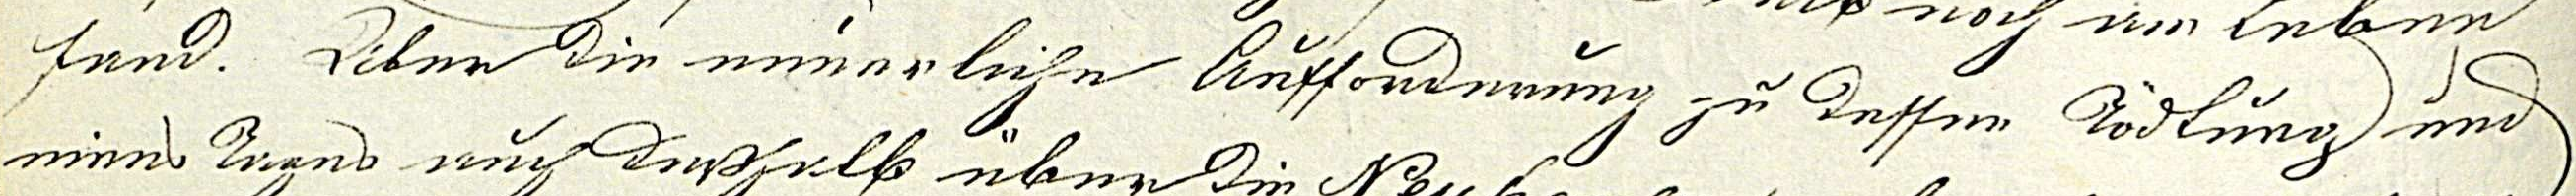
fand. Über die neuerliche Aufforderung zu dessen Tödtung und
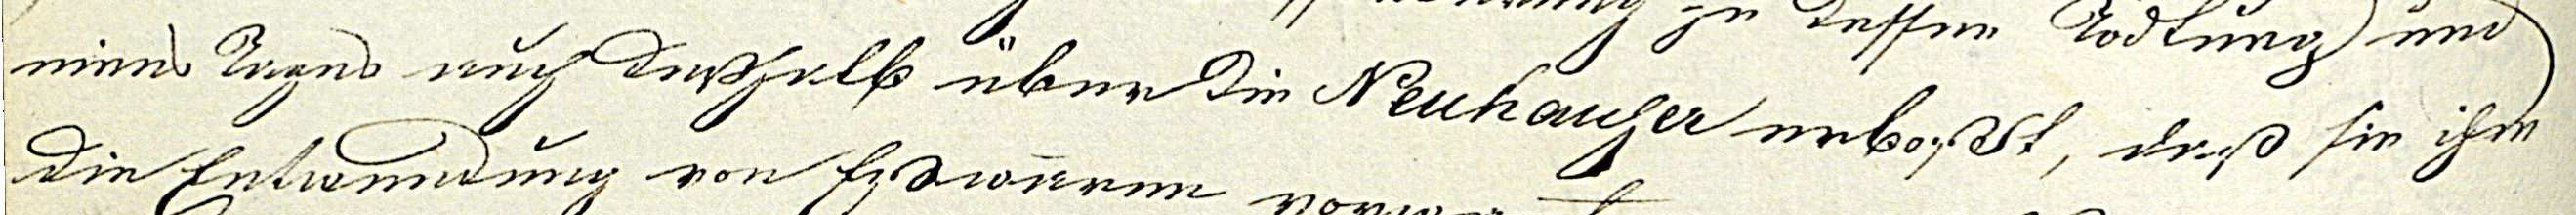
eines Tages auch deßhalb über die Neuhauser erboßt, daß sie ihm
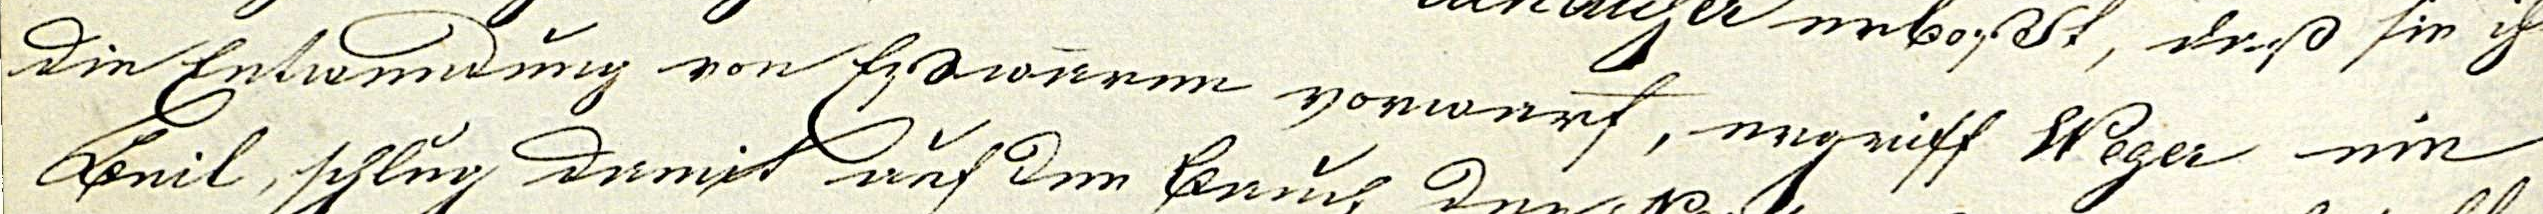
die Entwendung von Eydwaren vorwarf, ergriff Weger ein
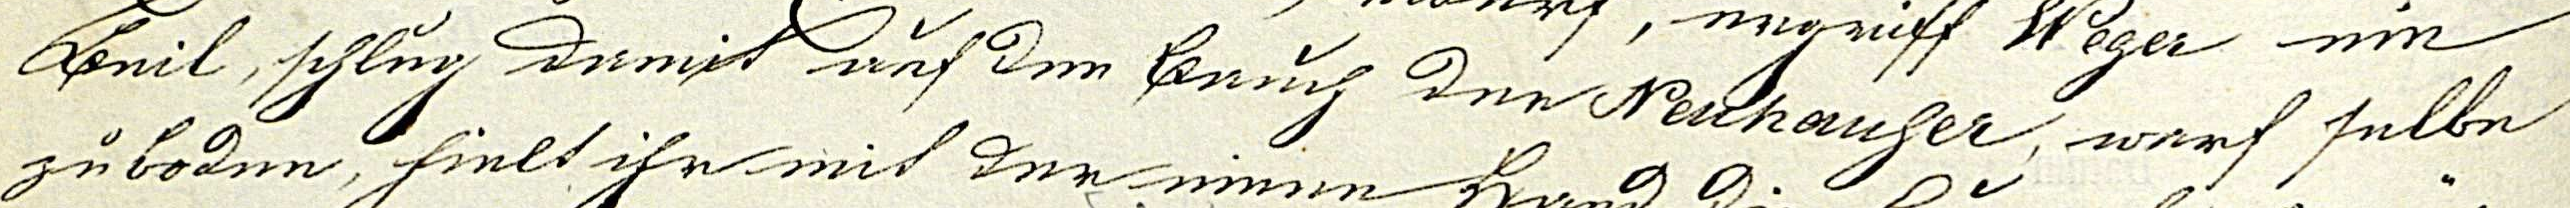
Beil, schlug damit auf dem Bauch der Neuhauser, warf selbe
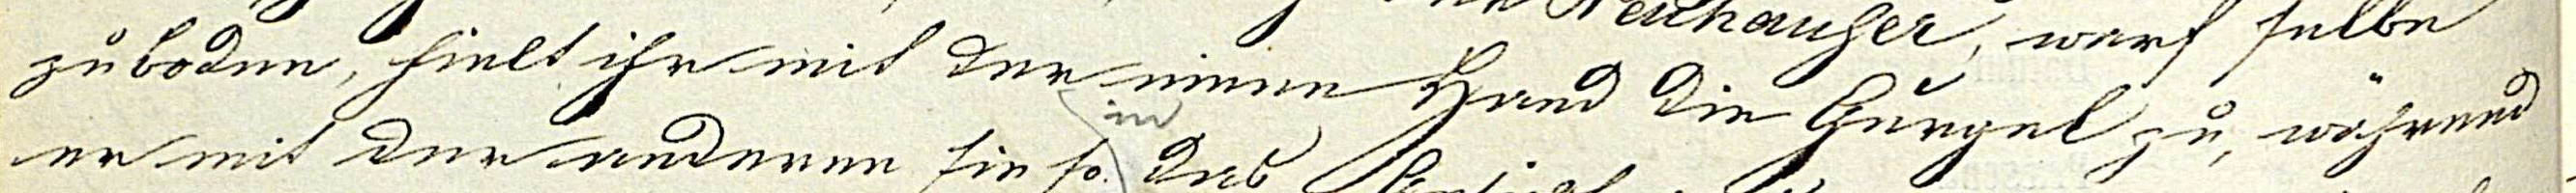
zu Boden, hielt ihr mit der einen Hand die Gurgel zu, während
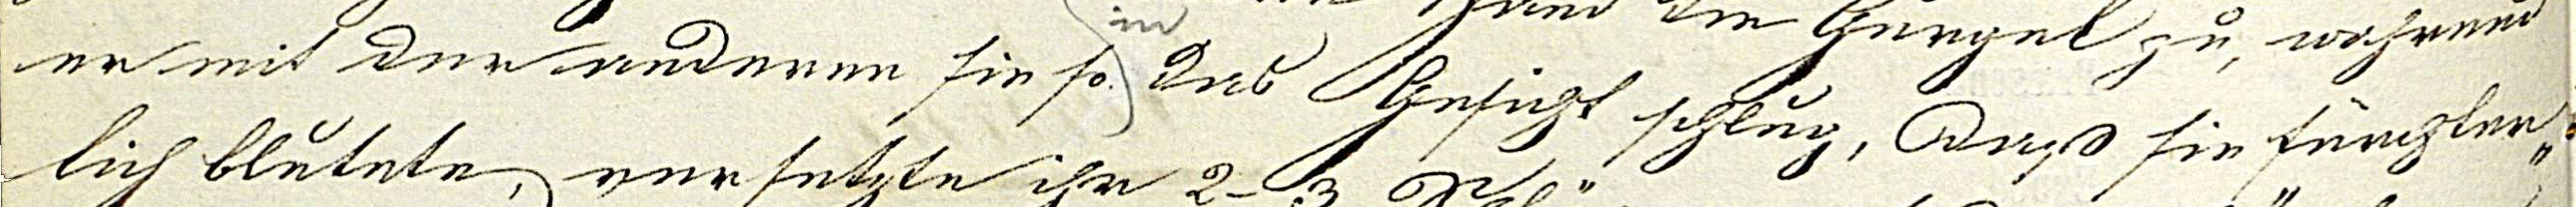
er mit der anderen sie so in das Gesicht schlug, daß sie fürchter¬
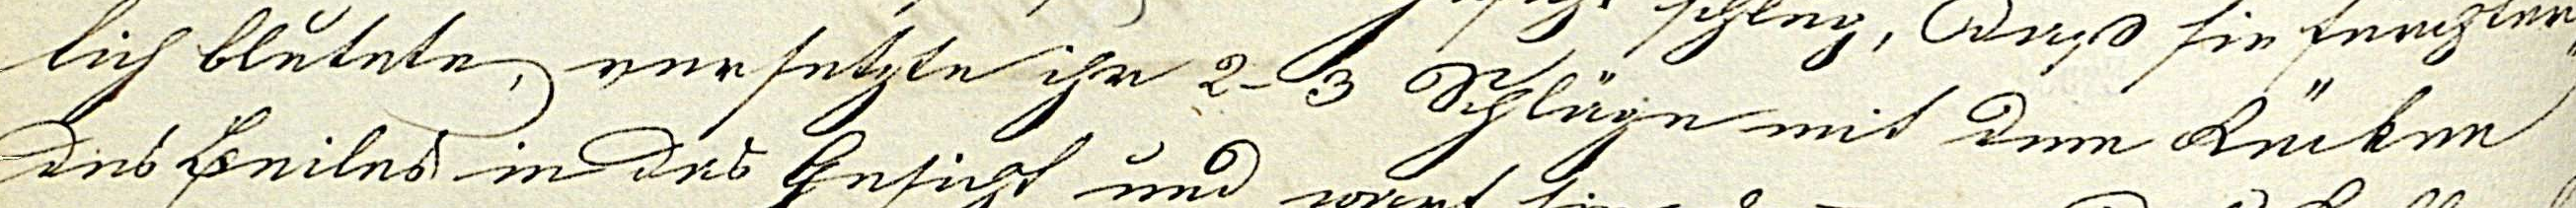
lich blutete, versetzte ihr 2-3 Schläge mit dem Rücken
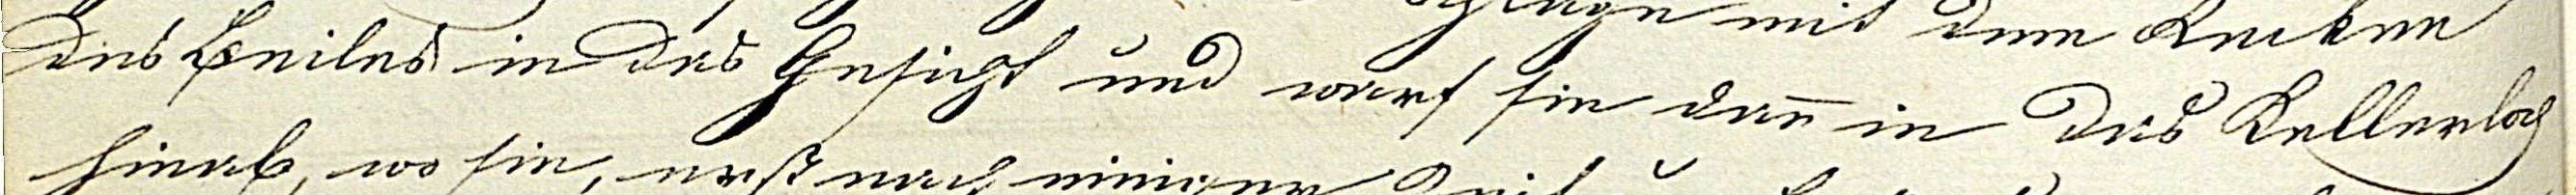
des Beiles in das Gesicht und warf sie dann in das Kellerloch
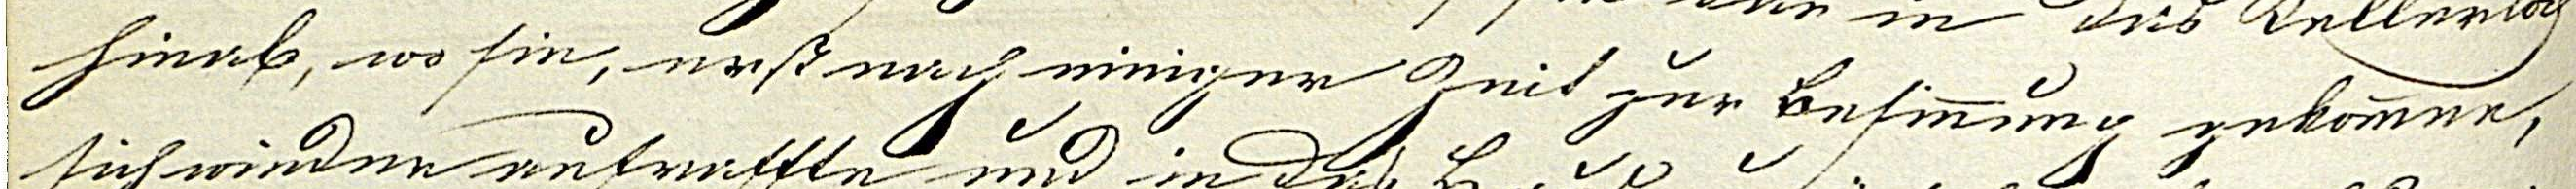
hinab, wo sie, erst nach einiger Zeit zur Besinnung gekommen,
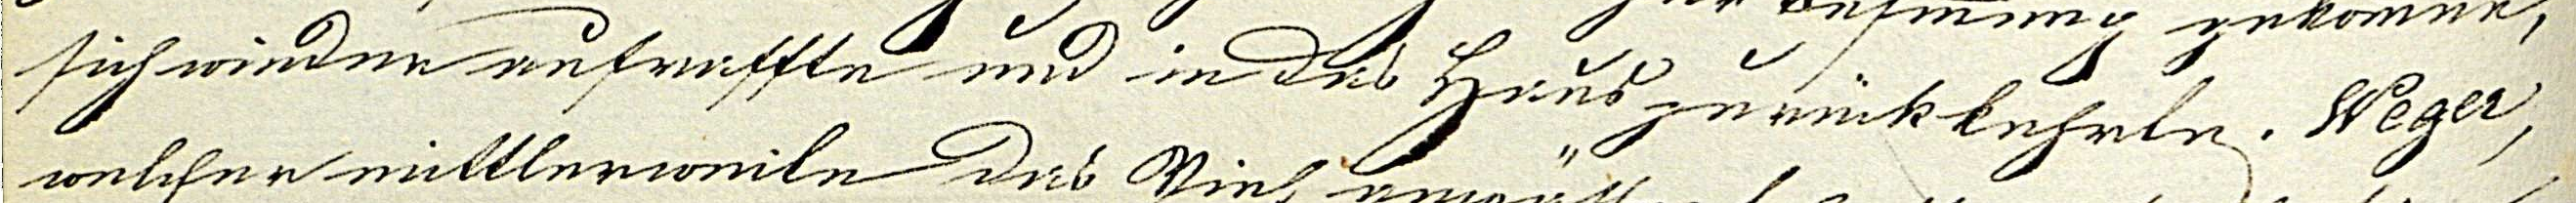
sich wieder aufraffte und in das Haus zurückkehrte. Weger,
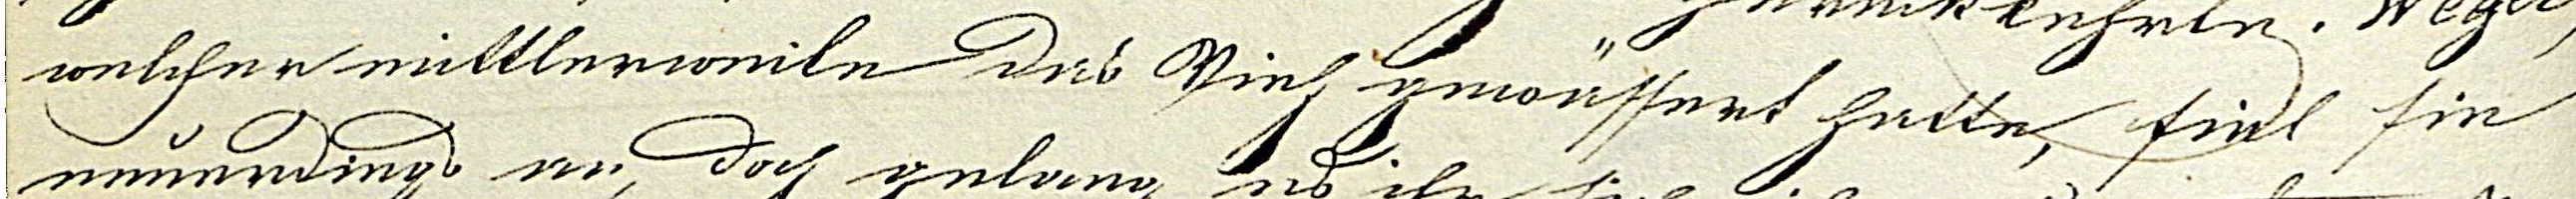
welcher mittlerweile das Vieh gewässert hatte, fiel sie
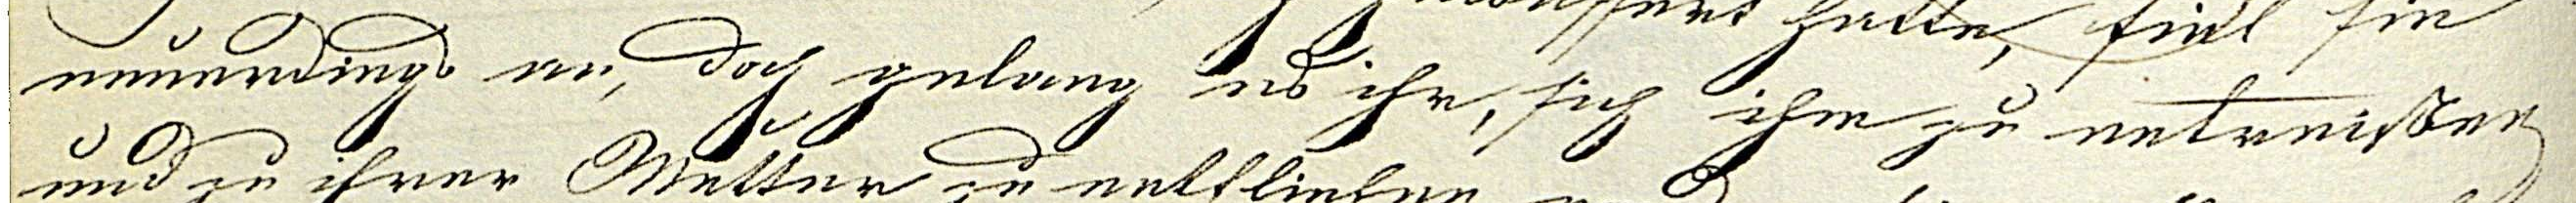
neuerdings an, doch gelang es ihr, sich ihm zu entreißen
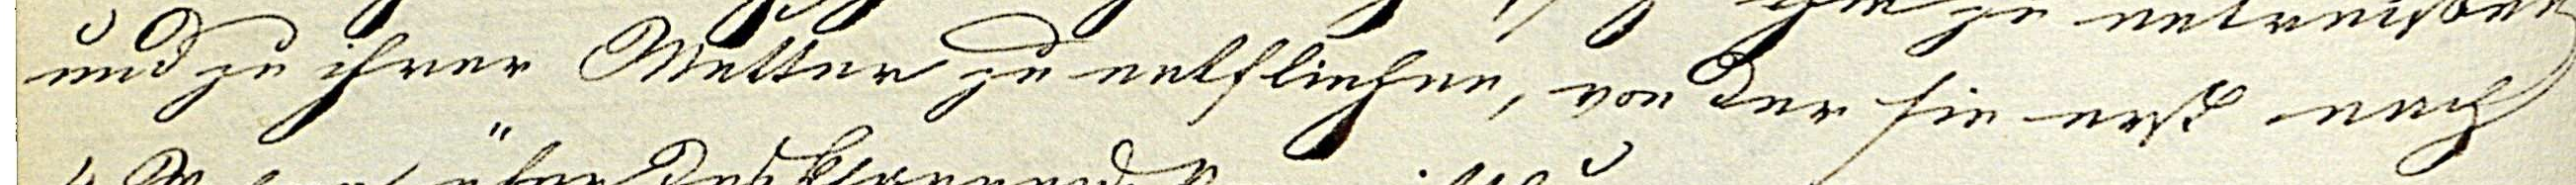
und zu ihrer Mutter zu entfliehen, von der sie erst nach
